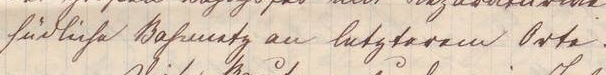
südliche Bahnnetz an letzterem Orte.
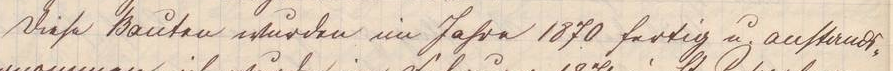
Diese Bauten wurden im Jahre 1870 fertig u. anstands-
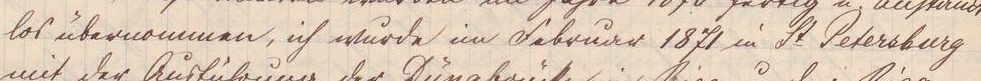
los übernommen, ich wurde im Februar 1871 in St Petersburg
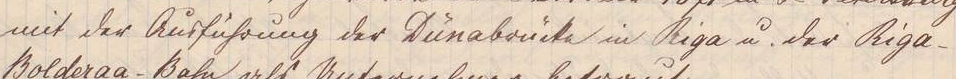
mit der Ausführung der Dünabrücke in Riga u. der Riga-
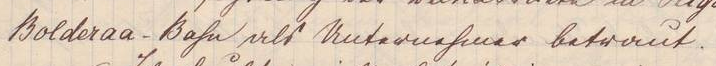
Boderaa-Bahn als Unternehmer betraut.
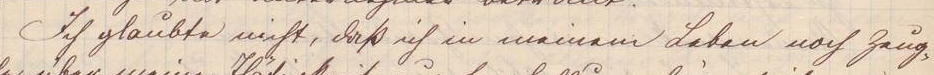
Ich glaubte nicht, daß ich in meinem Leben noch Zeug-
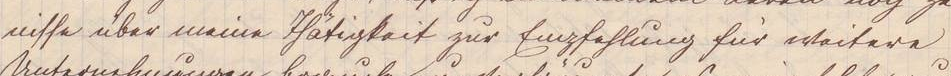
nisse über meine Thätigkeit zur Empfehlung für weitere
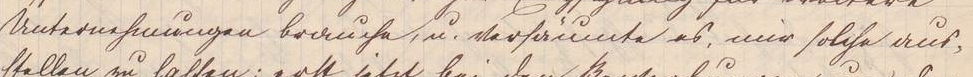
Unternehmungen brauche, u. versäumte es, mir solche aus-
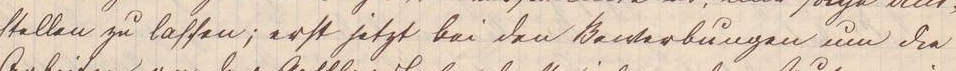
stellen zu lassen; erst jetzt bei den Bewerbungen um die
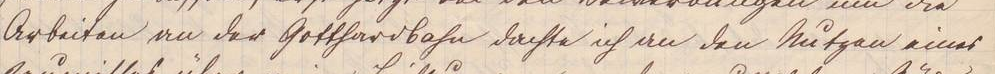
Arbeiten an der Gotthardbahn dachte ich an den Nutzen eines
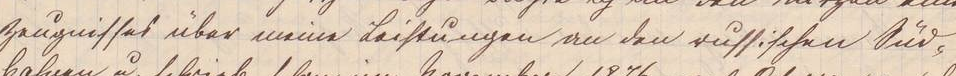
Zeugnisses über meine Leistungen an den russischen Süd-
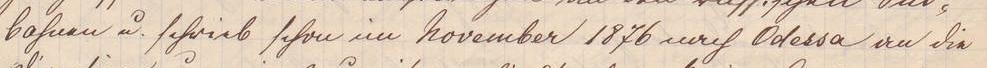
bahnen u. schrieb schon im November 1876 nach Odessa an die
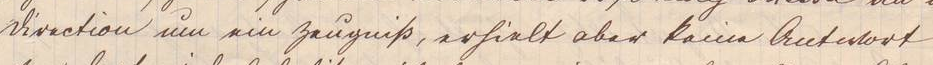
Direction um ein Zeugniß, erhielt aber keine Antwort
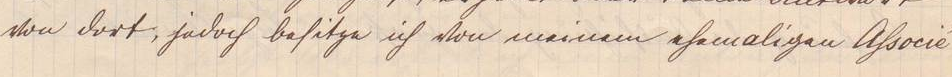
von dort, jedoch besitze ich von meinem ehemaligen Associé
